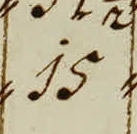15
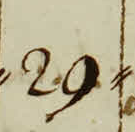29
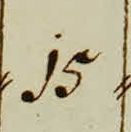15
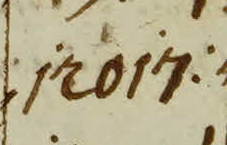12017
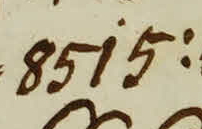8515
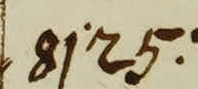8125
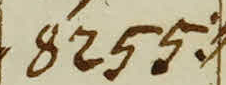8255
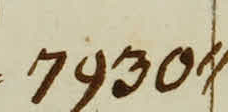7930
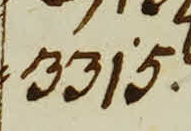3315
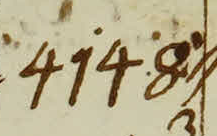4148
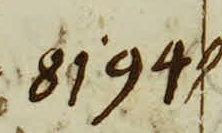8194
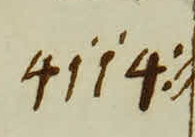4114
